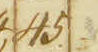45.
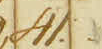41.
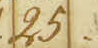25
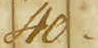40
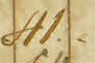41.
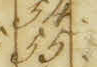55
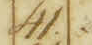41.
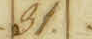31.
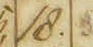18.
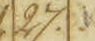27.
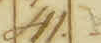41.
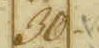30
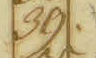39
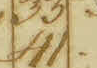41
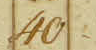40
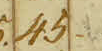45
